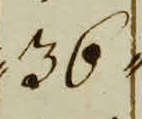36
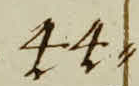44
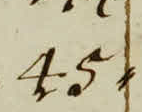45
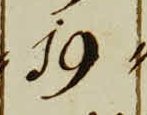19
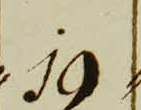19
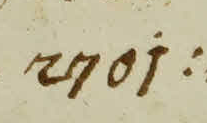2701
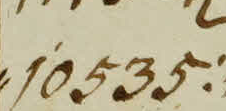10535
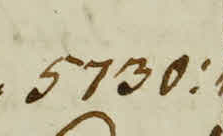5730
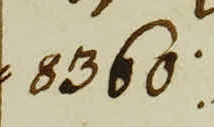8360
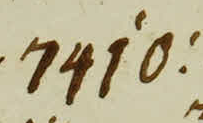7410
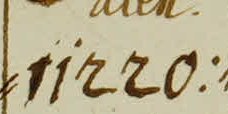11220
